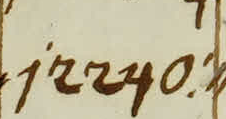12240.
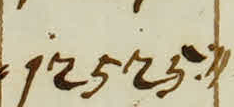12525.
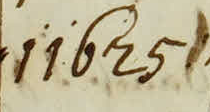11625
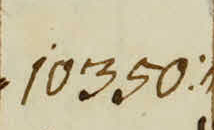10350
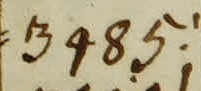3485
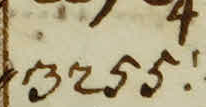3255
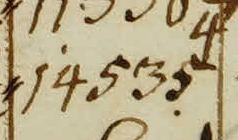14535
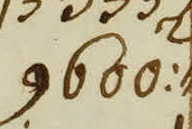9600
